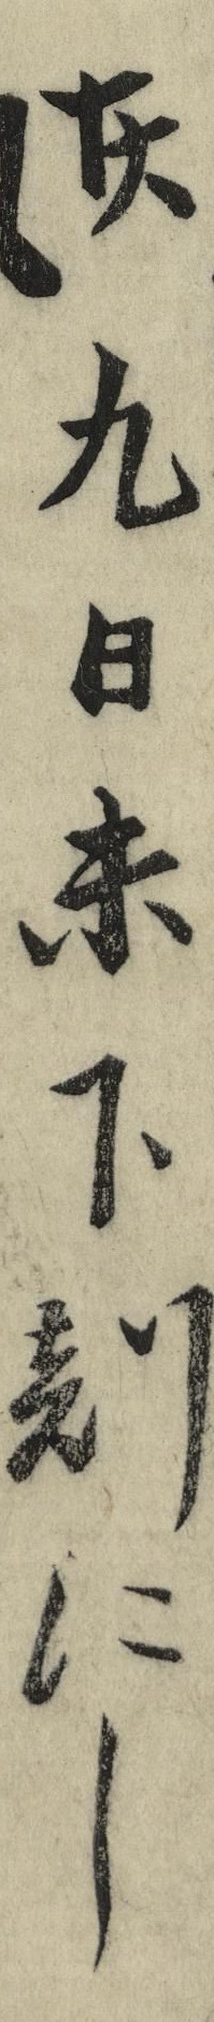廿九日未下刻にし
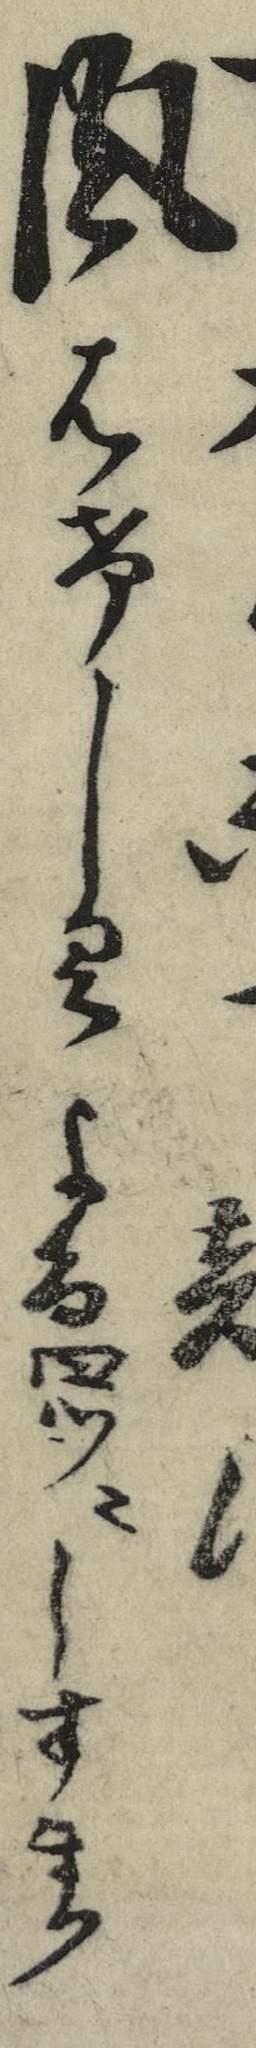風はけしくよる四ツにしすまる
